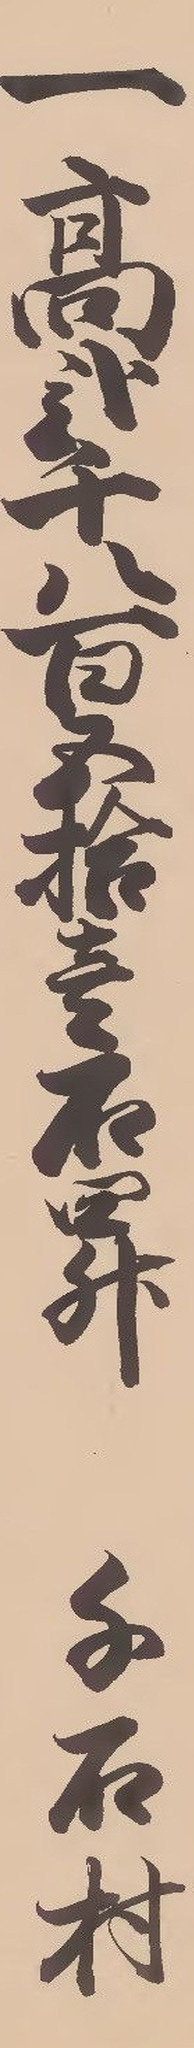一高弐千八百五拾壱石四升千石村
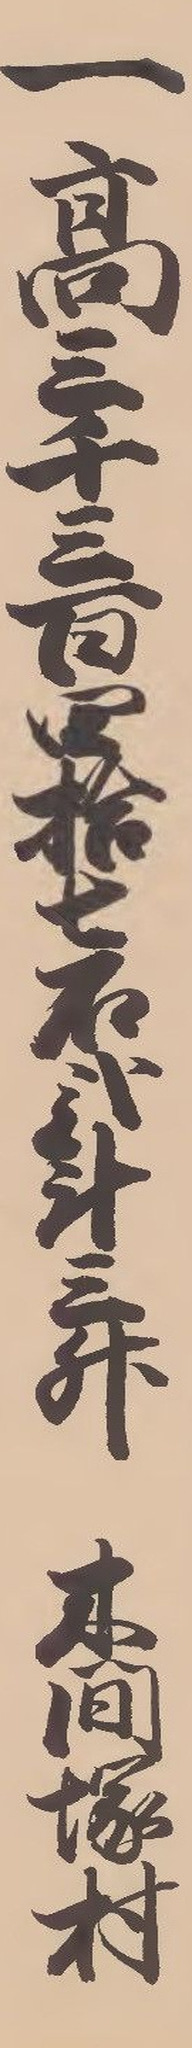一高三千三百四拾七石弐斗三升木間塚村
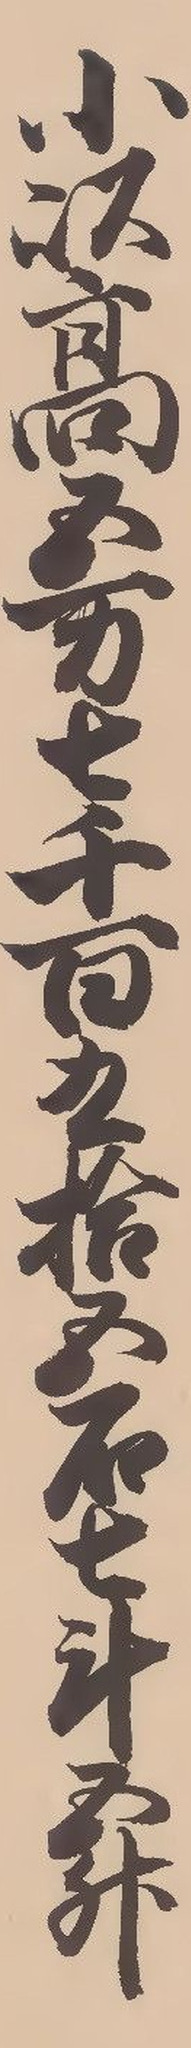小以高五万七千百九拾五石七斗五升

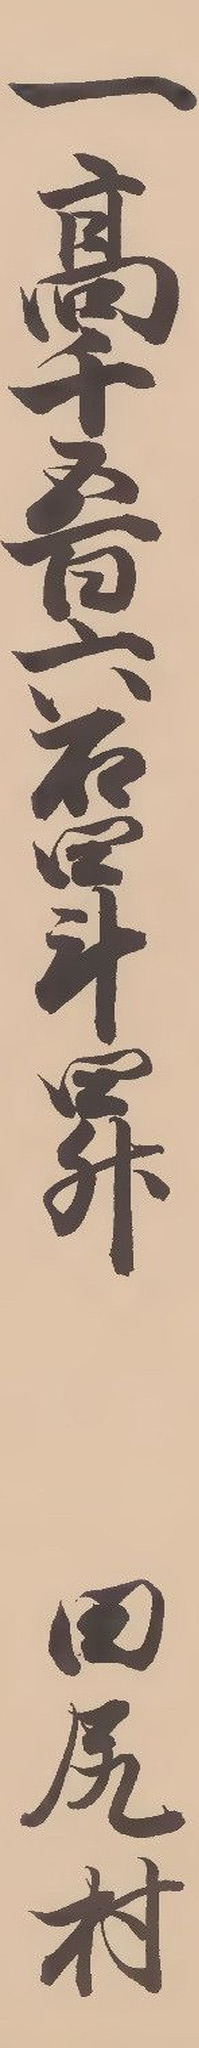一高千五百六石四斗四升田尻村
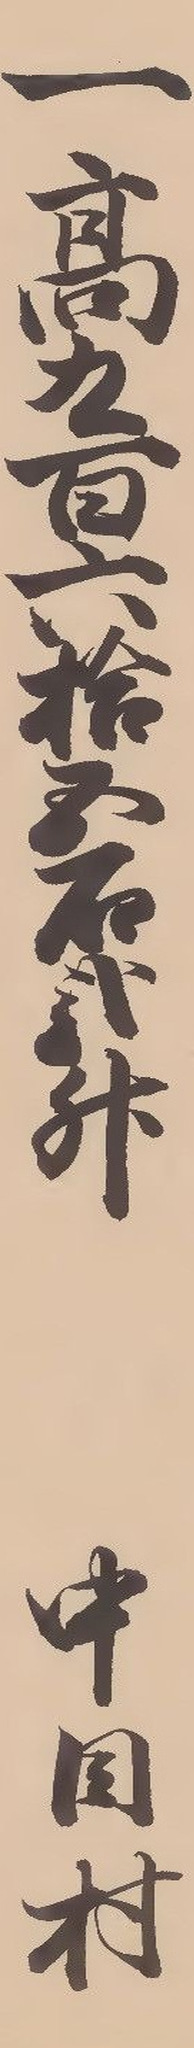一高九百六拾五石弐升中目村
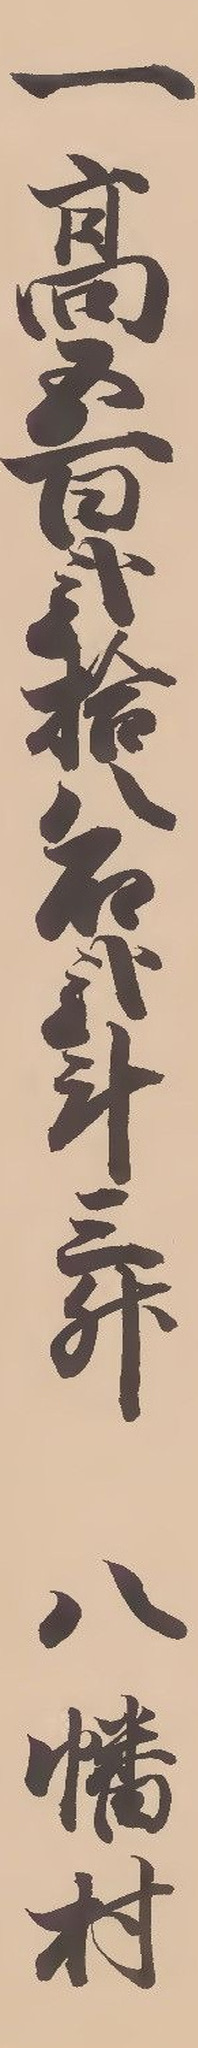一高五百弐拾八石弐斗三升八幡村
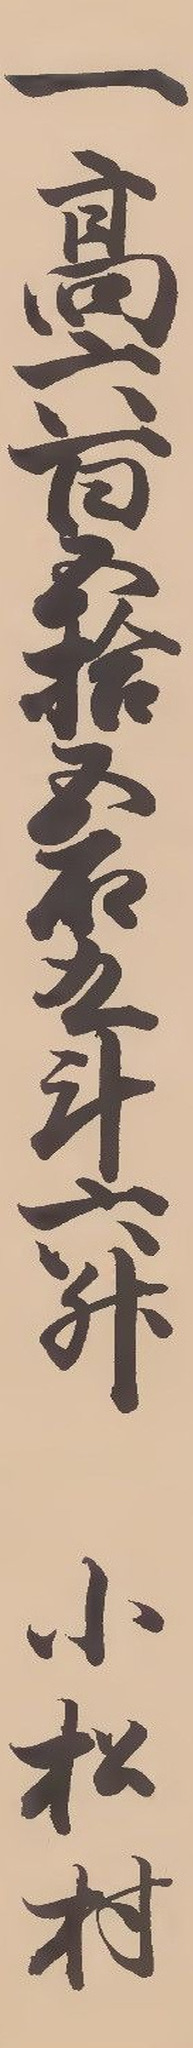一高六百五拾五石九斗六升小松村
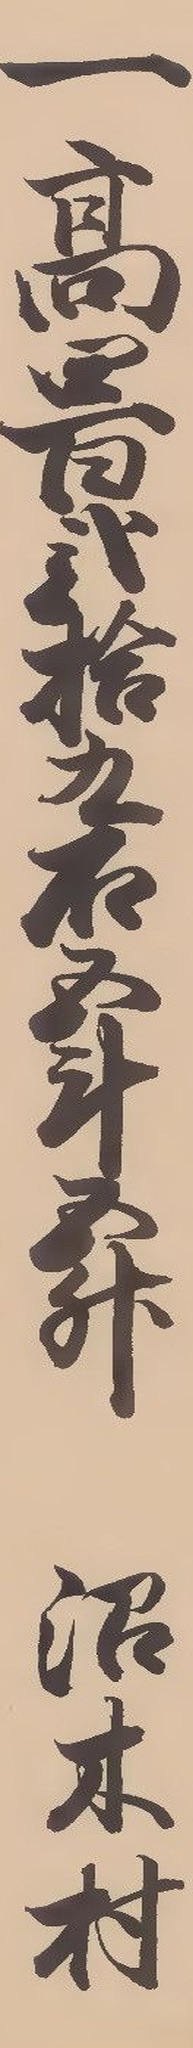一高四百弐拾九石五斗五升沼木村
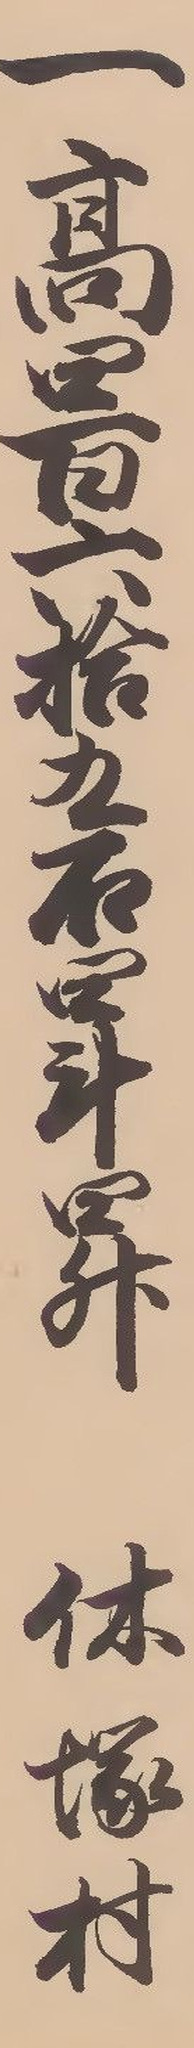一高四百六拾九石四斗四升休塚村

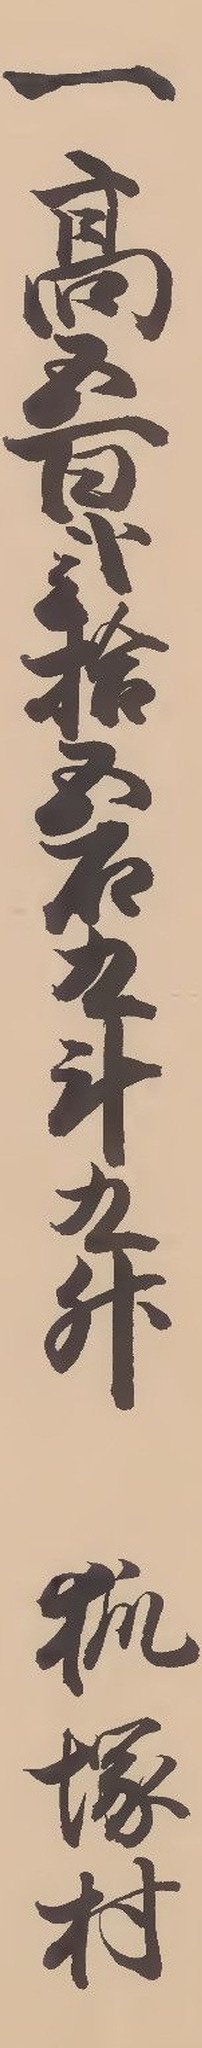一高五百弐拾五石九斗九升狐塚村
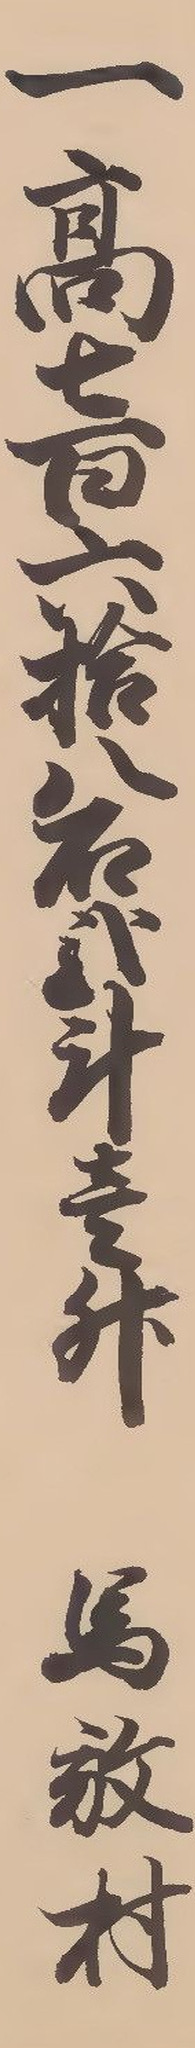一高七百六拾八石弐斗壱升馬放村
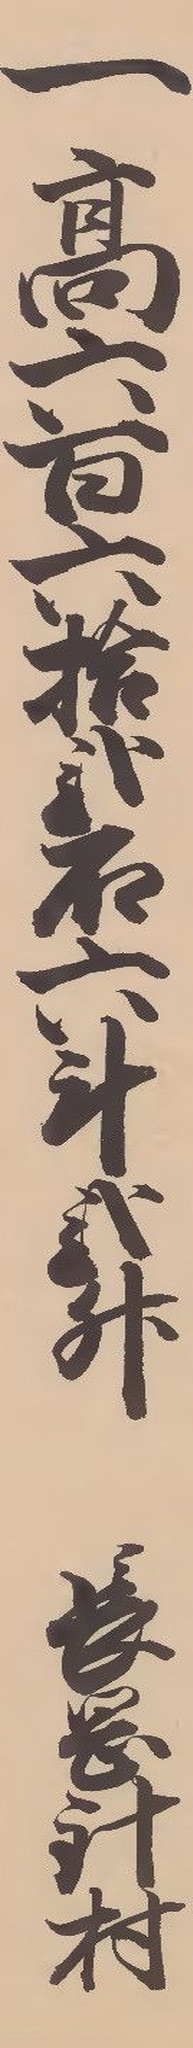一高六百六拾弐石六斗弐升長岡針村
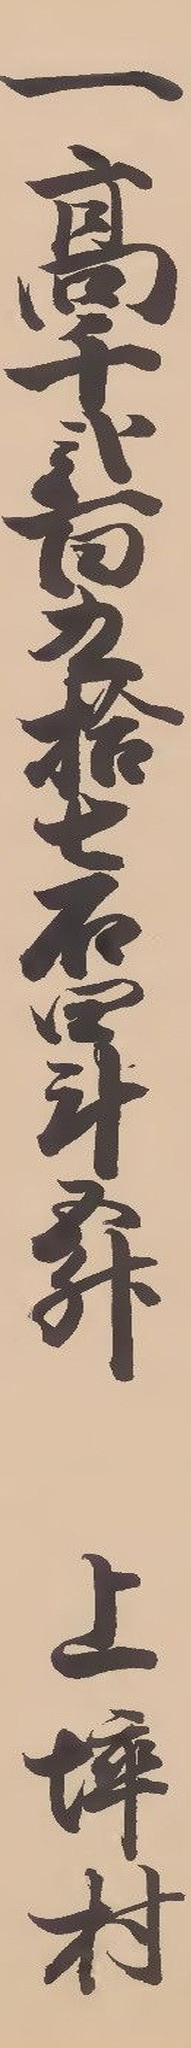一高千弐百九拾七石四斗五升上埣村
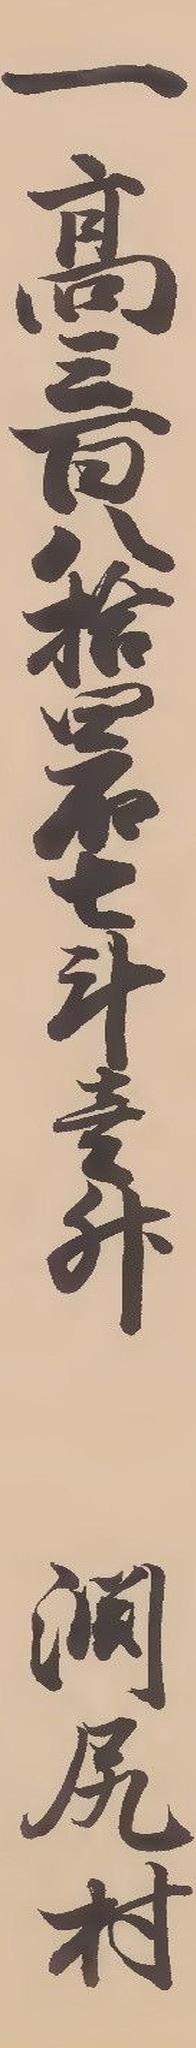一高三百八拾四石七斗壱升淵尻村
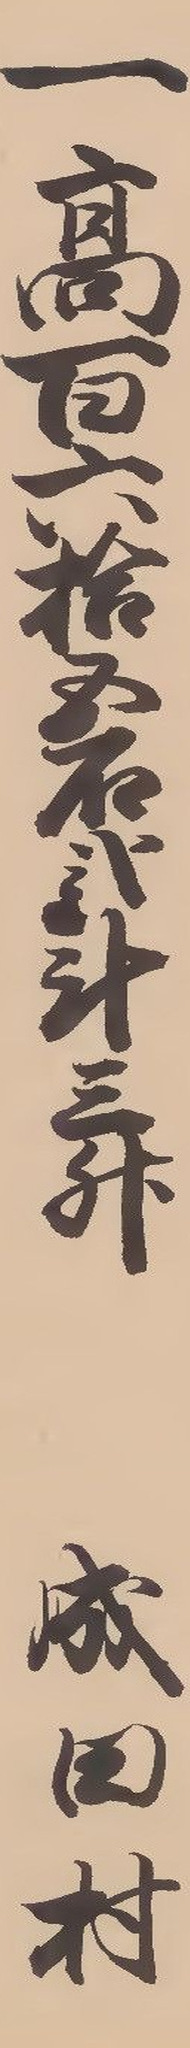一高百六拾五石弐斗三升成田村
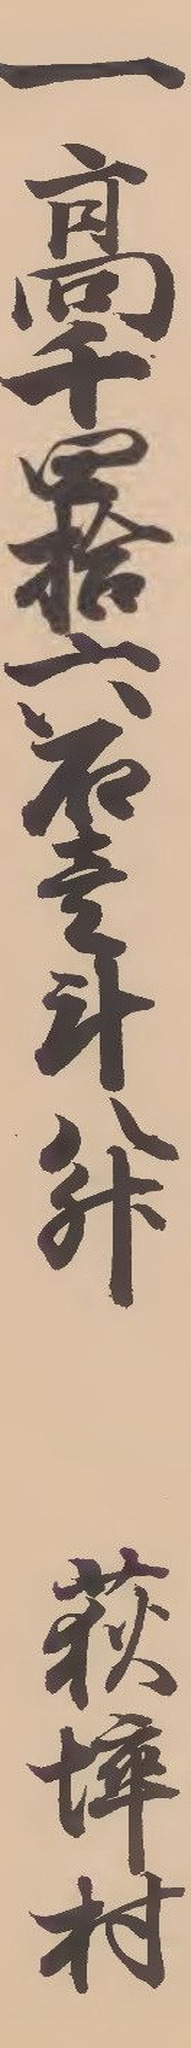一高千四拾六石壱斗八升荻埣村
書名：陸奥国郷帳　５
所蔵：国立公文書館 National Archives of Japan
